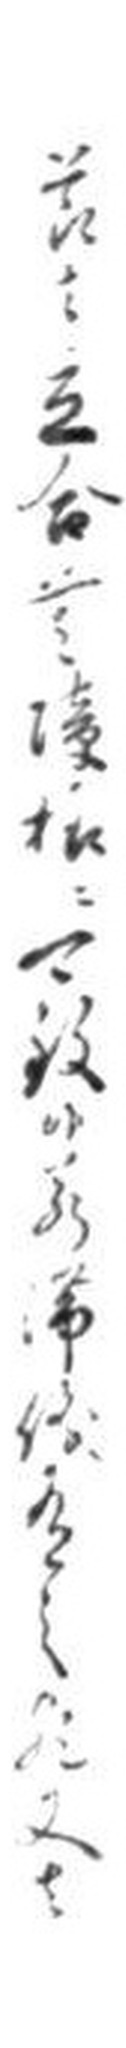節者立合無障様ニ可致候若滞儀有之歟又者
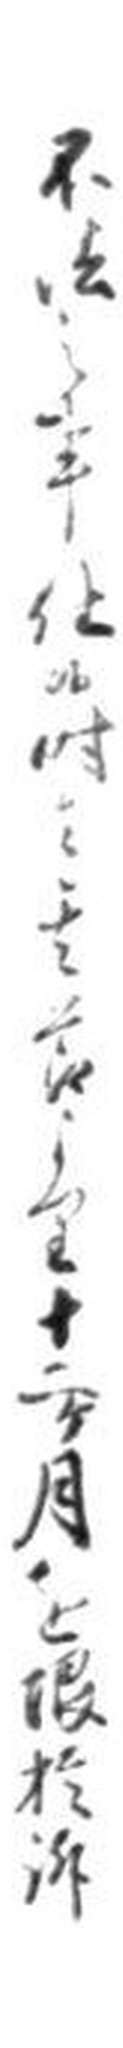不法之事仕候時者其節より十二ケ月を限於訴
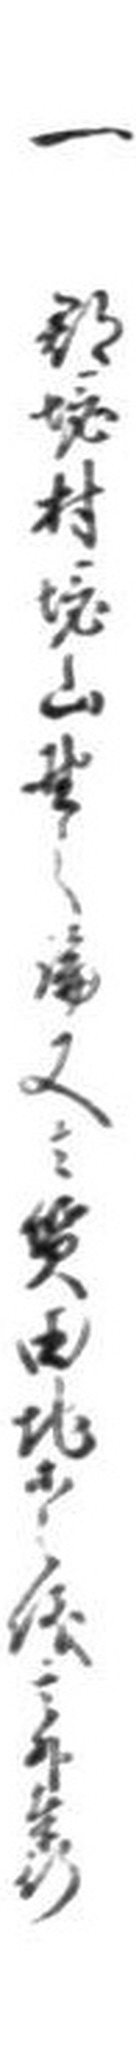一郡境村境山野之論又者質田地等之儀其外奉行
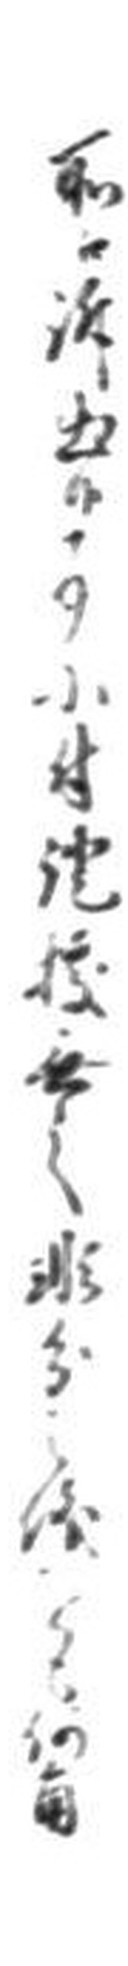所江訴出候事に付証拠無之非分之儀をも何角
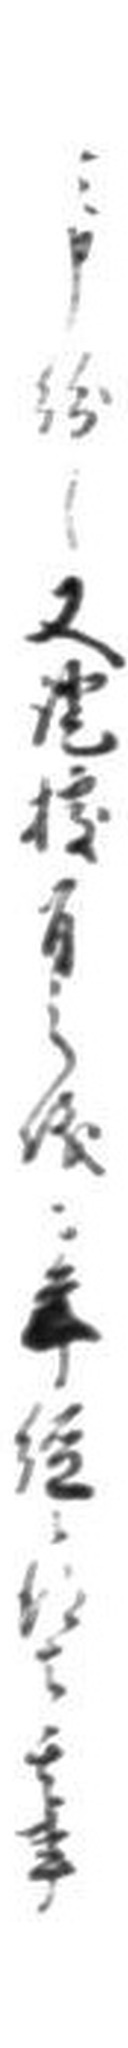与申紛し又証拠有之儀ニ年経候得者其事
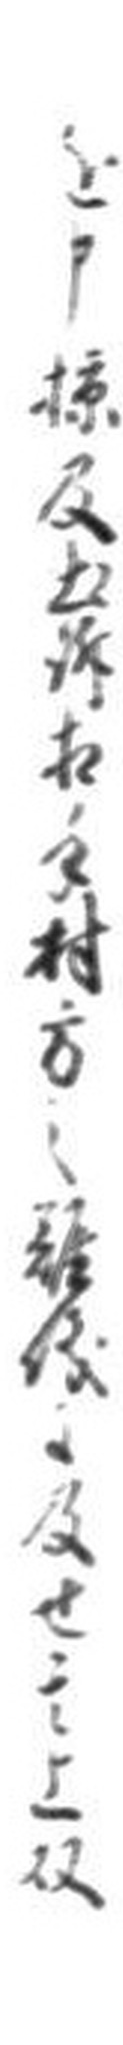を申掠及出訴相手村方之難儀に及せ其上双
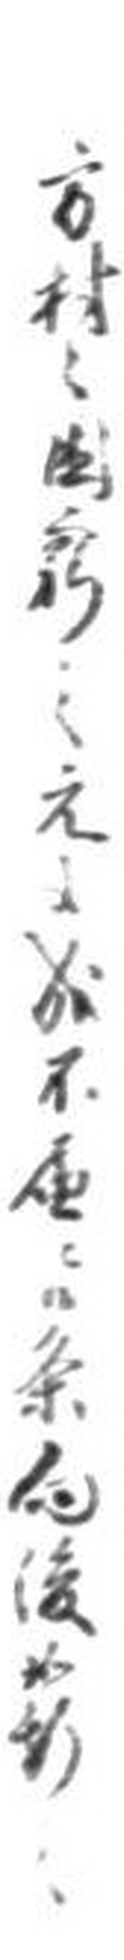方村々困窮之元に成不届ニ候条向後如斯之
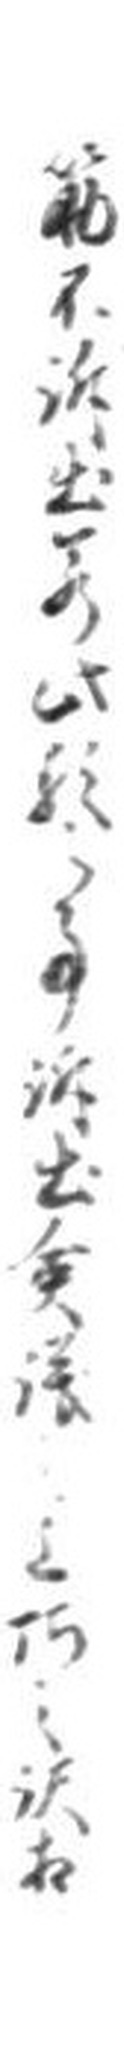筋不訴出若此類之事訴出僉議之上巧之訳相
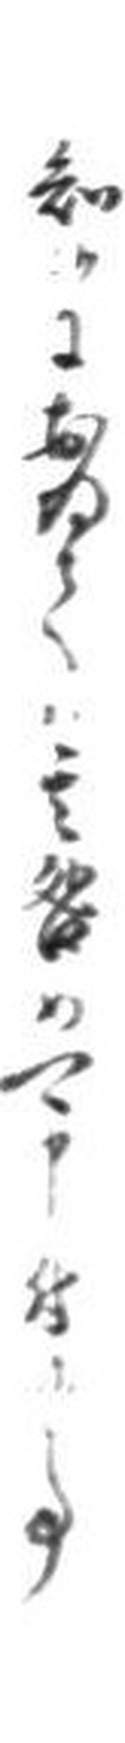知候におゐてハ其咎め可申付候事
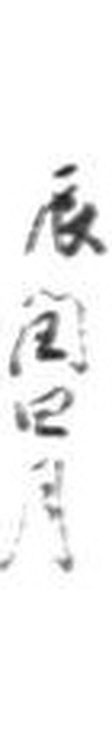辰閏四月

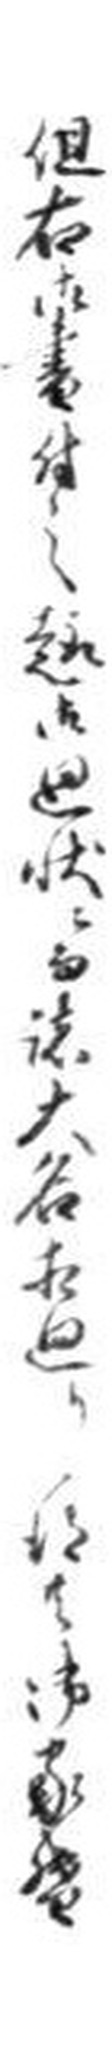但右御書付之趣御廻状ニ而諸大名相廻り候得共御家替
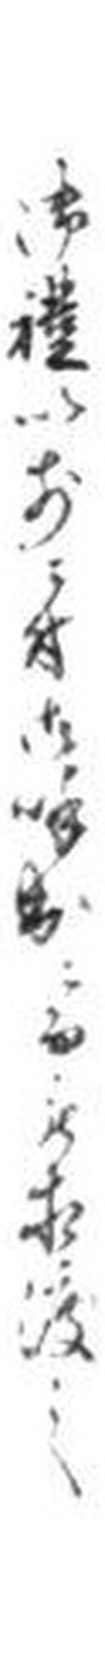御礼以前ニ付御呼出ニ而被相渡之
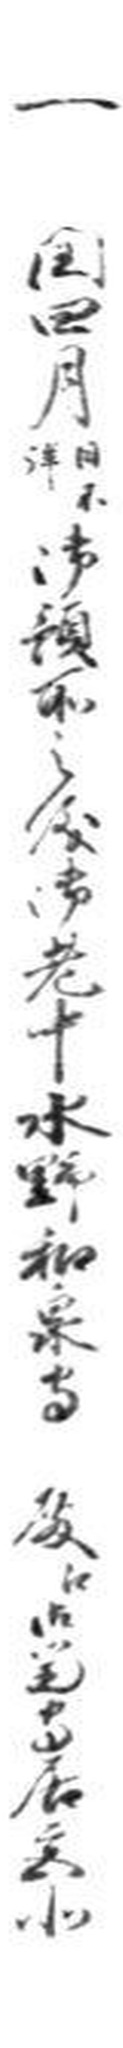一閏四月日不詳御領所之儀御老中水野和泉守御留守居宮北
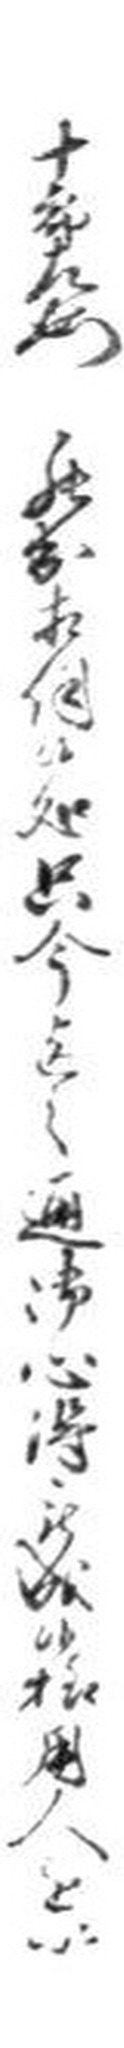十郎左衛門罷出相伺候処只今迄之通御心得被成候様用人を以
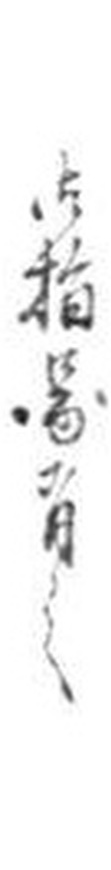御指図有之
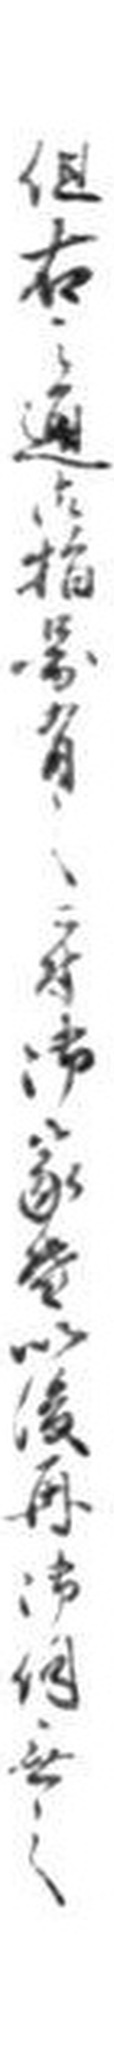但右之通御指図有之ニ付御家督以後再御伺無之
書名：家譜 三十七 宗矩公 従正徳五年到享保九年五月
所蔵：福井県文書館 Fukui Prefectural Archives
